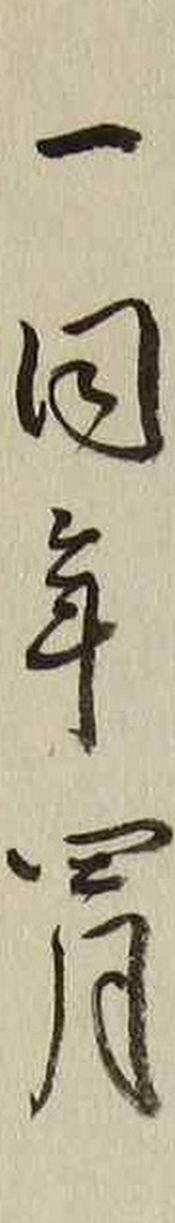一同年四月
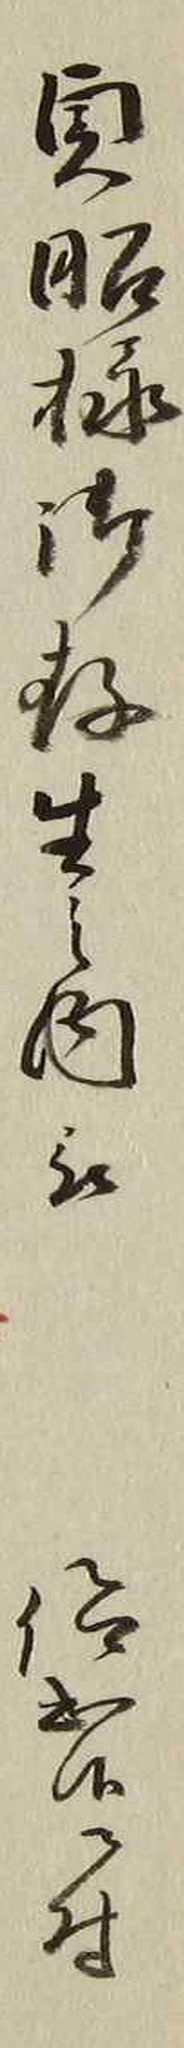貞昭様御存生之内被仰出候ニ付
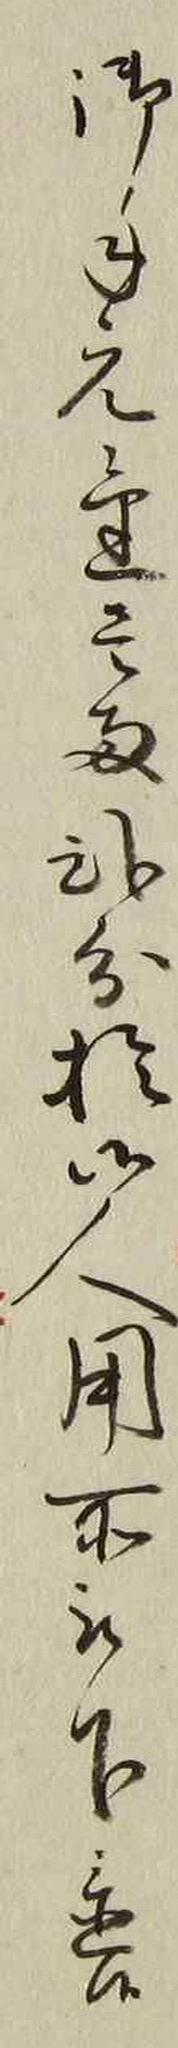御手元金壱両弐分於御人用所被下置候
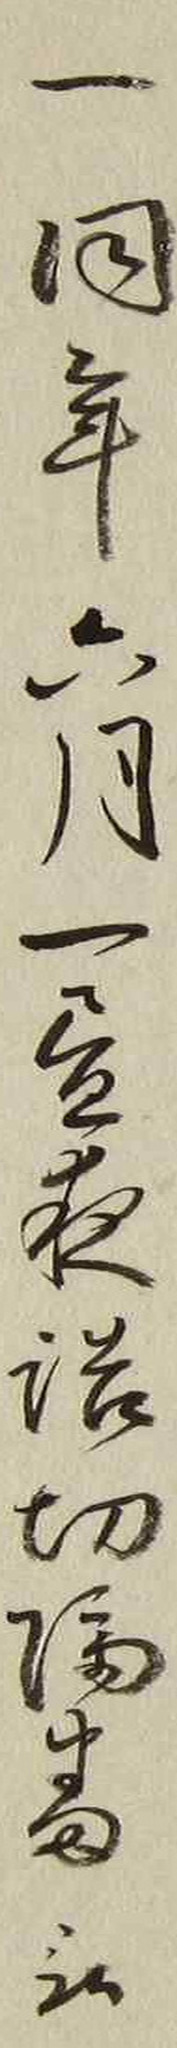一同年六月一昼夜詰切隔番被
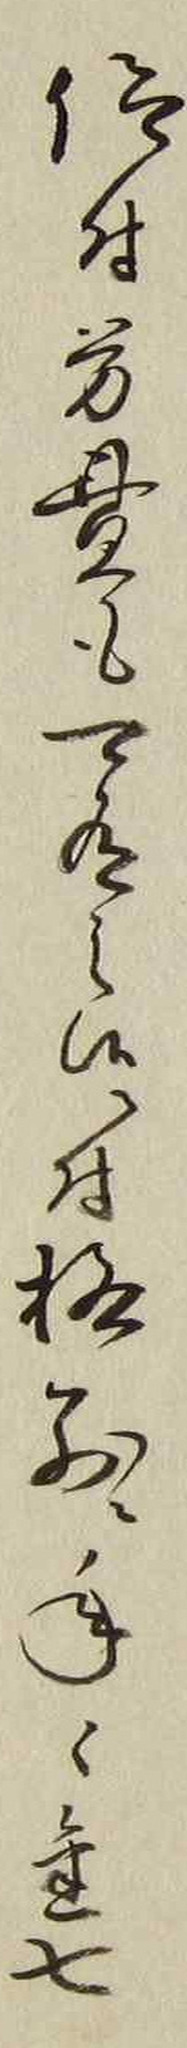仰付労費も可有之候ニ付格別ニ年々金七
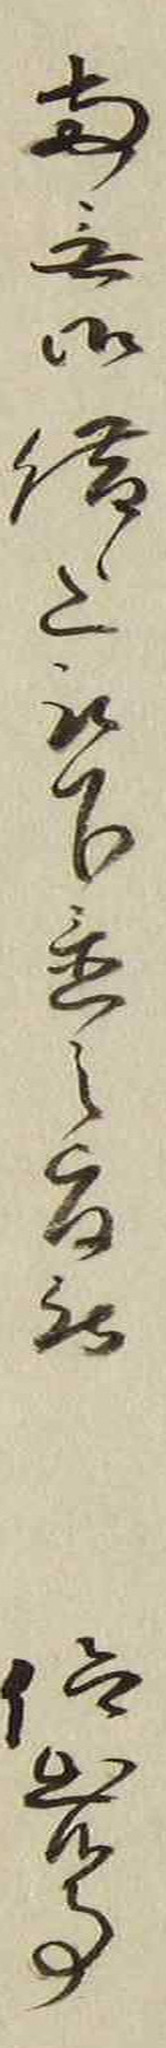両無御借上被下置之旨被仰出候事

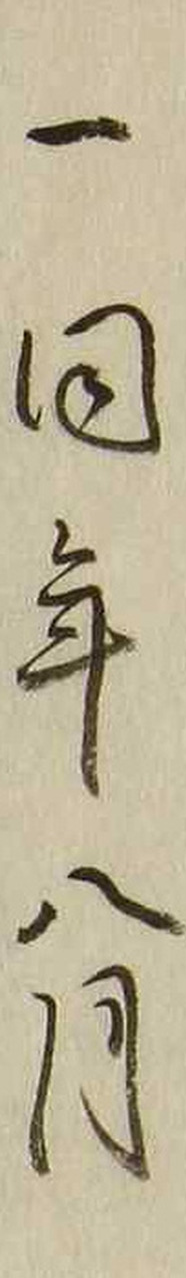一同年八月
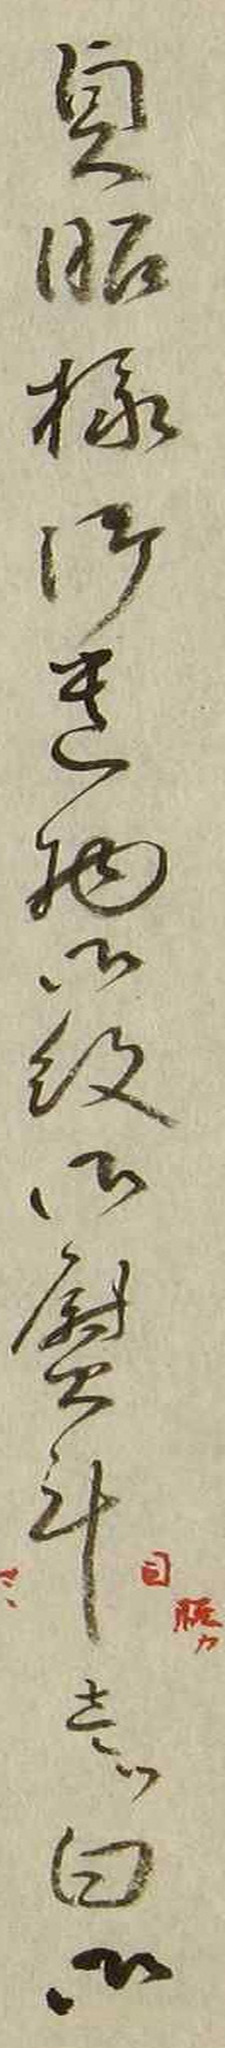貞昭様御遺物御紋御熨斗壱ツ白御
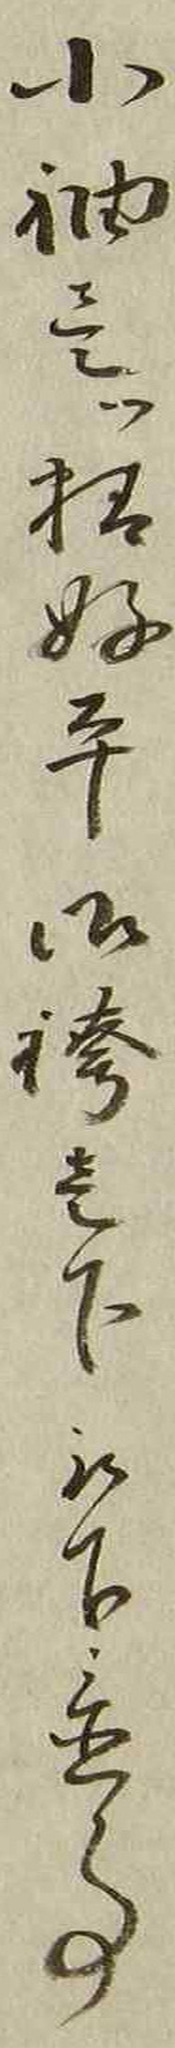小袖壱ツ精好平御袴壱下被下置候事
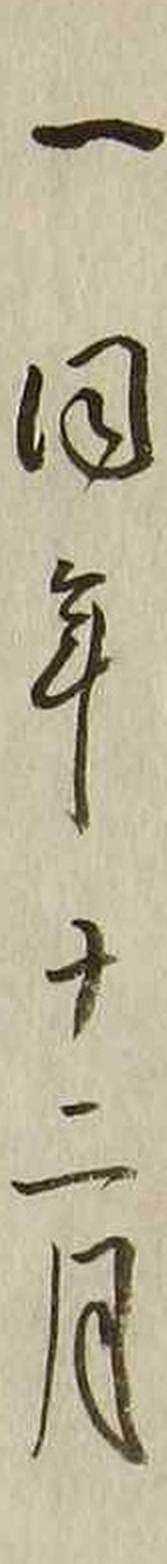一同年十二月
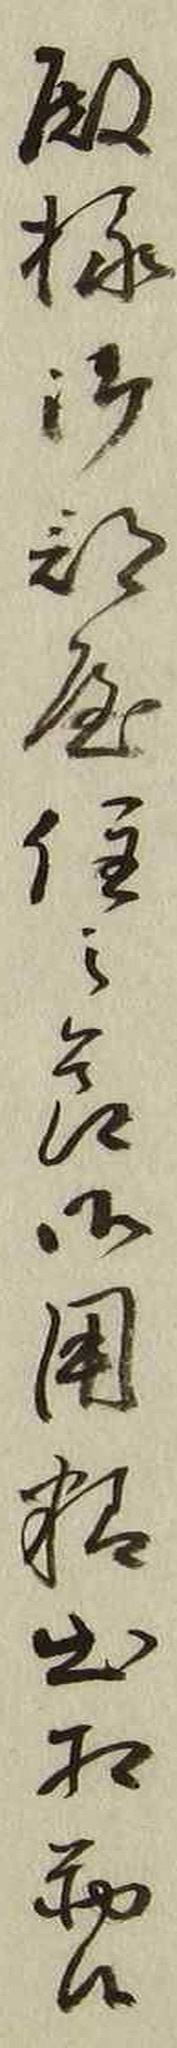殿様御部屋住之節御用精出相勤候
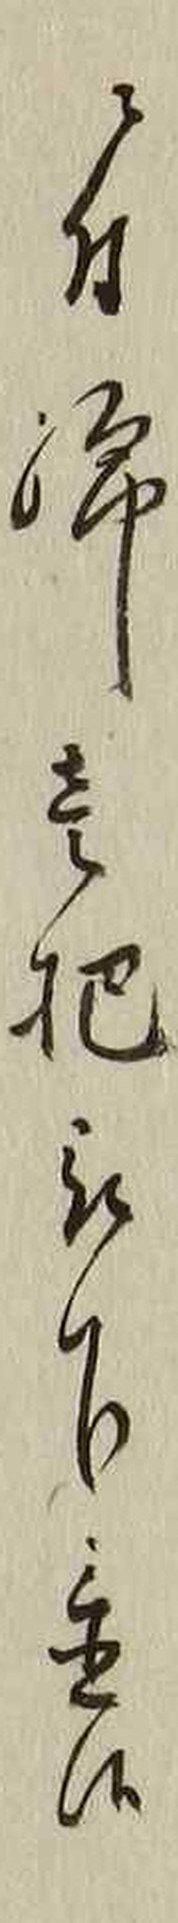ニ付綿壱把被下置候
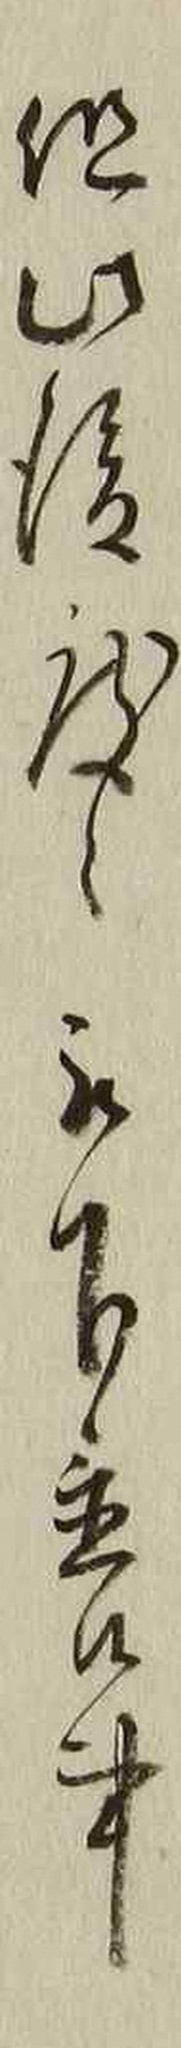但此後度々被下置候事
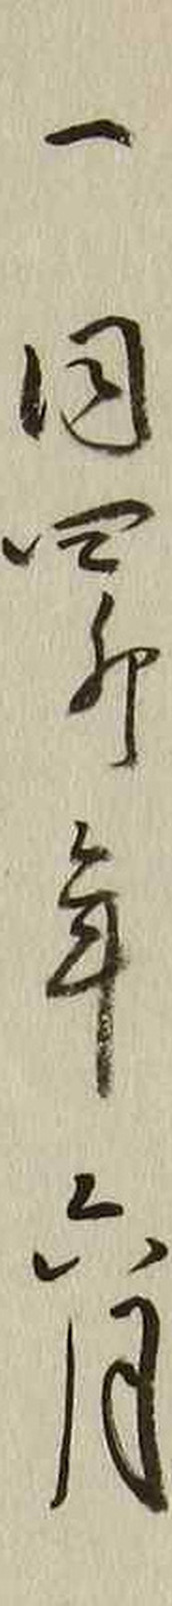一同四卯年六月
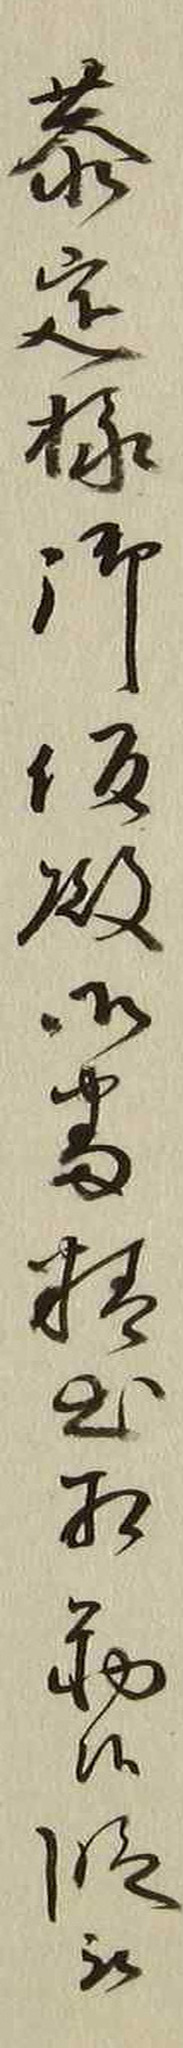恭定様御仮殿御番精出相勤候段被
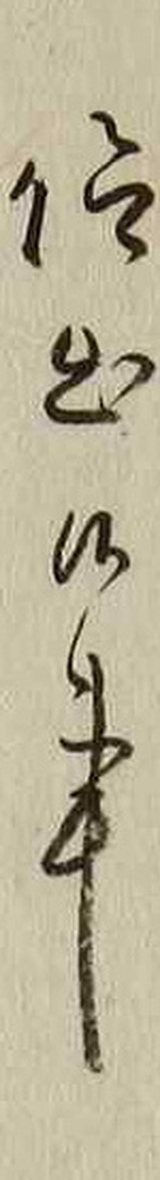仰出候事
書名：諸士系譜　巻之4　い之部4
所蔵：会津若松市立会津図書館
